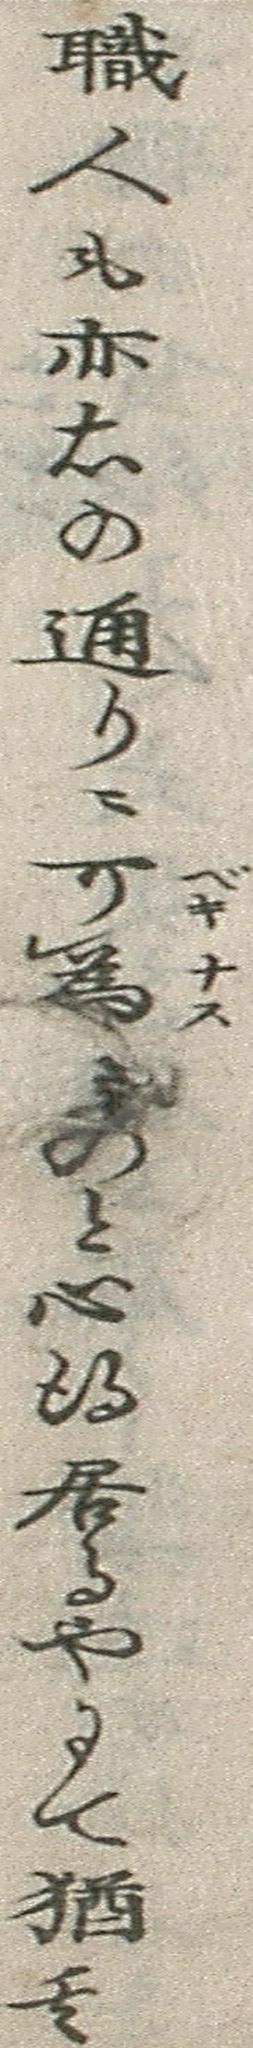職人も亦右の通り可為ものと心得居るやにて猶其
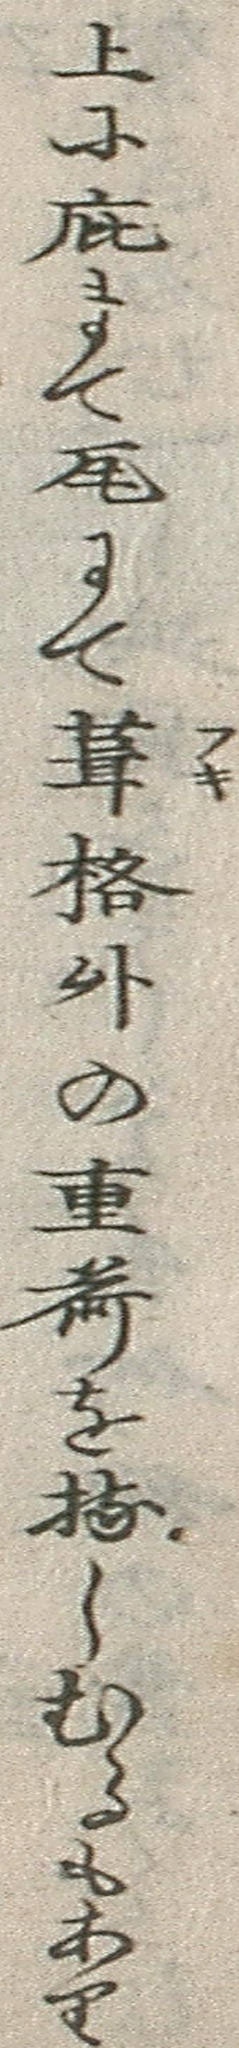上に庇まて瓦にて葺格外の重荷を持しむるもあり
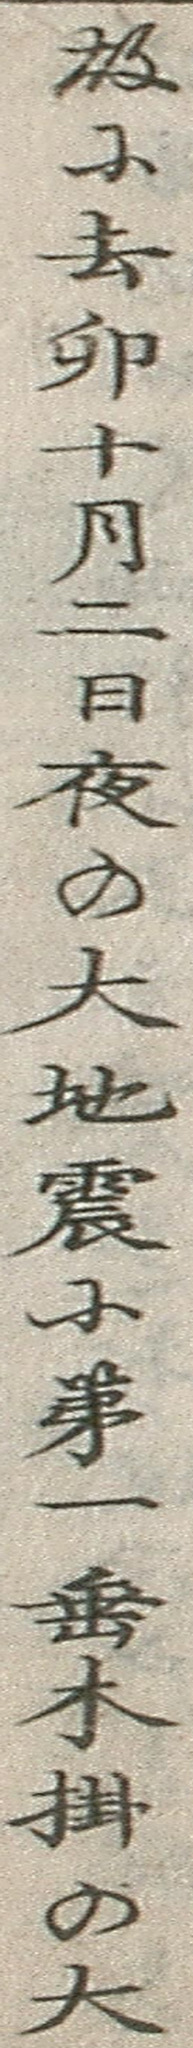故に去卯十月二日夜の大地震に第一垂木掛の大
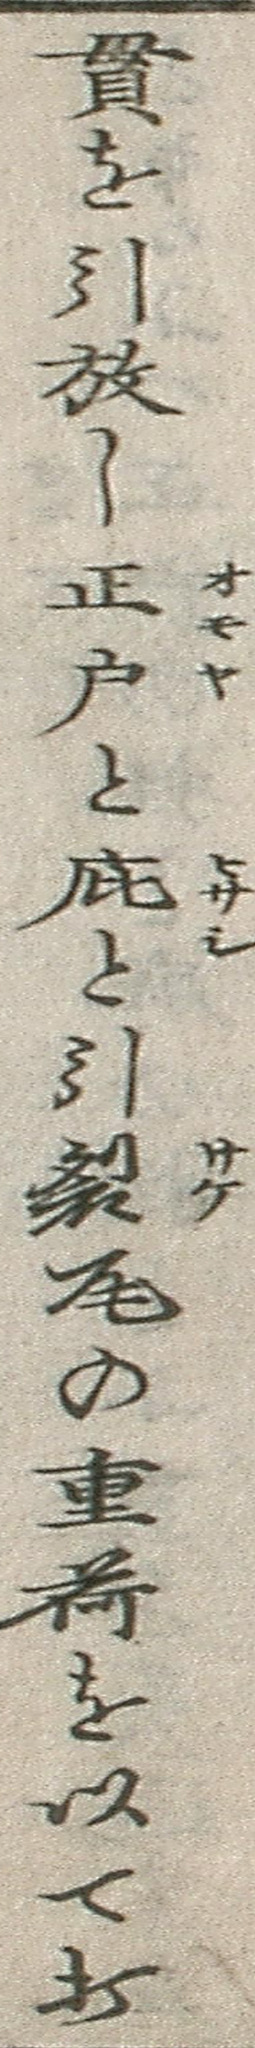貫を引放し正戸と庇と引裂瓦の重荷を以て打
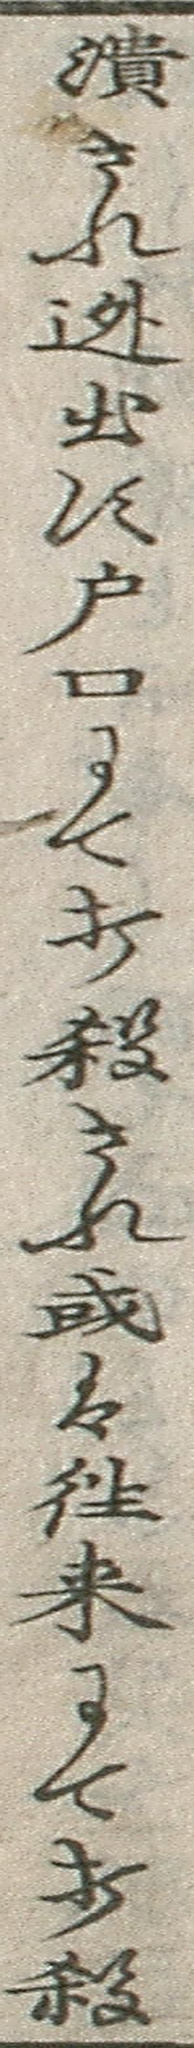潰され逃出す戸口にて打殺され或は往来にて打殺
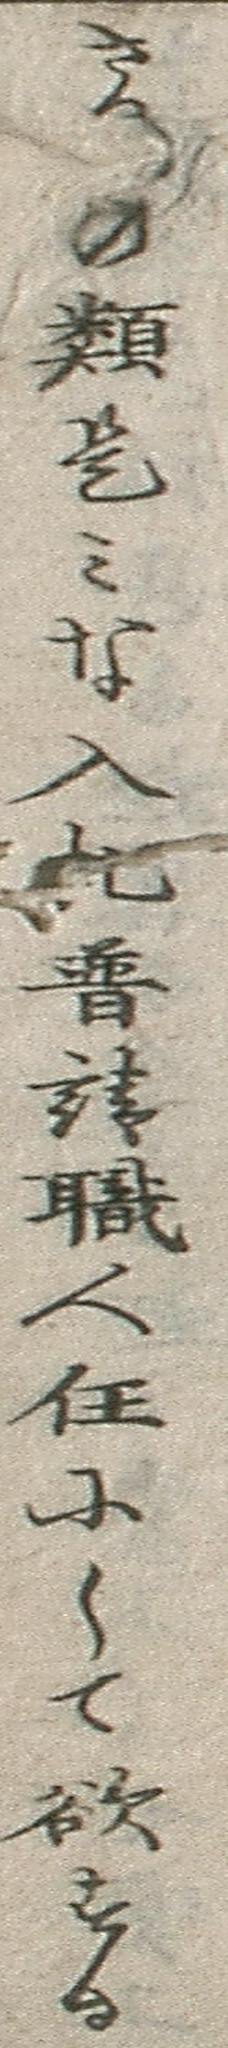さるの類是みな入札普請職人任にして欲する

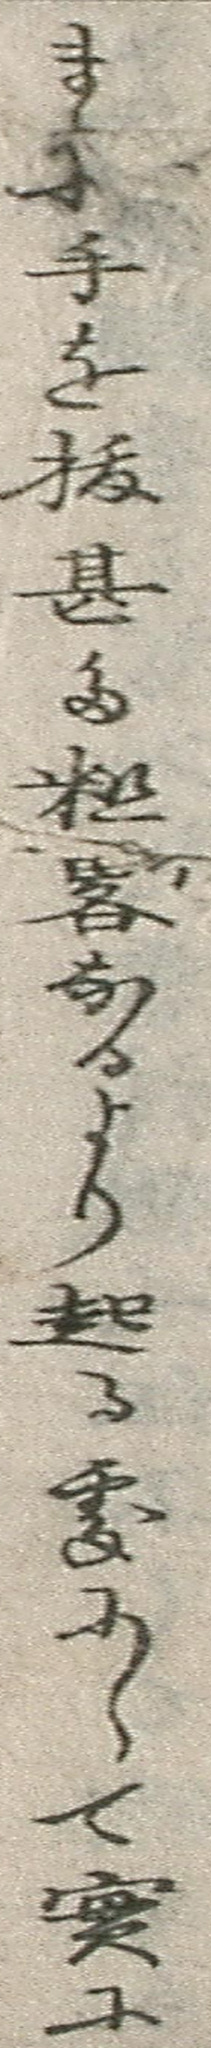まゝに手を抜甚た粗略なるより起る処にして実に
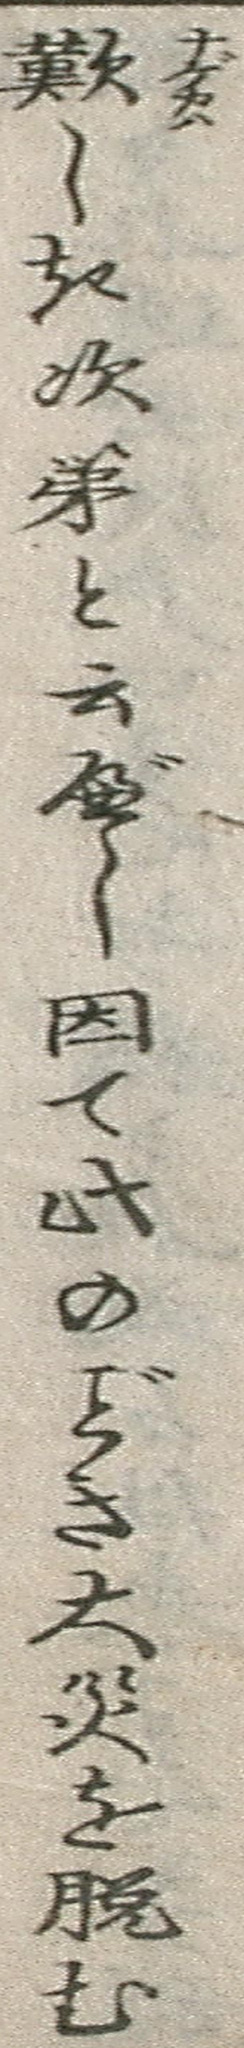歎しき次第と云べし因て此のごとき大災を脱む
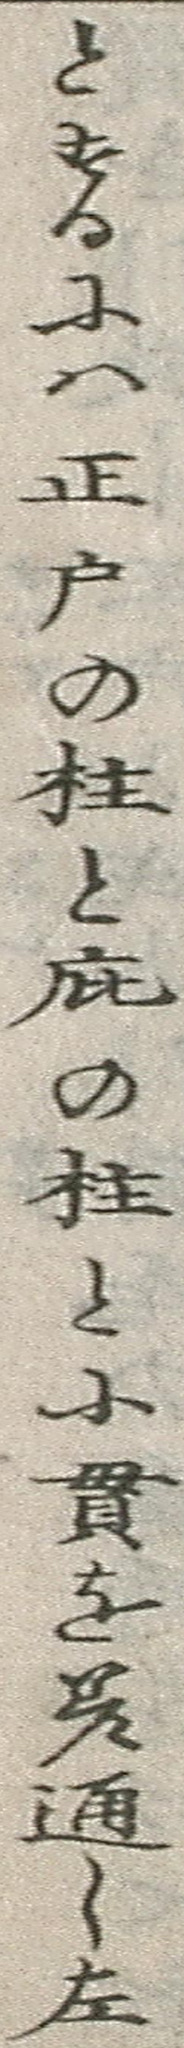とするには正戸の柱と庇の柱とに貫を差通し左
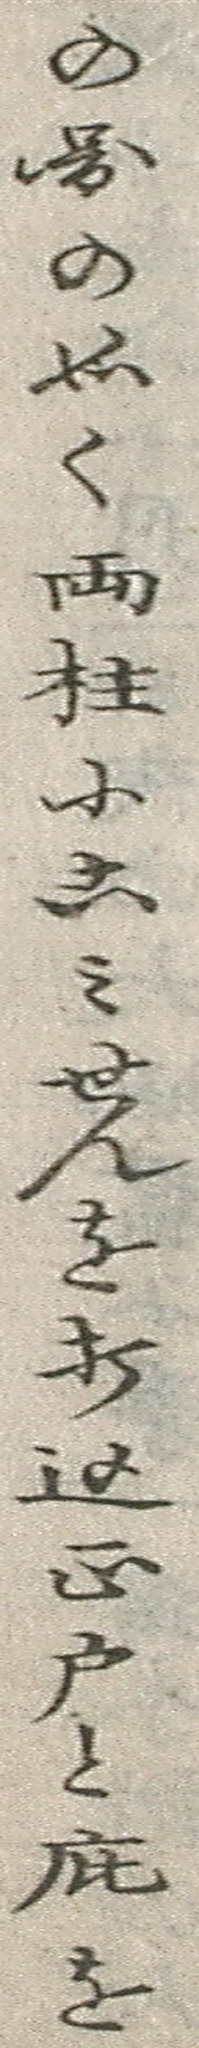の図の如く両柱にこみせんを打込正戸と庇を
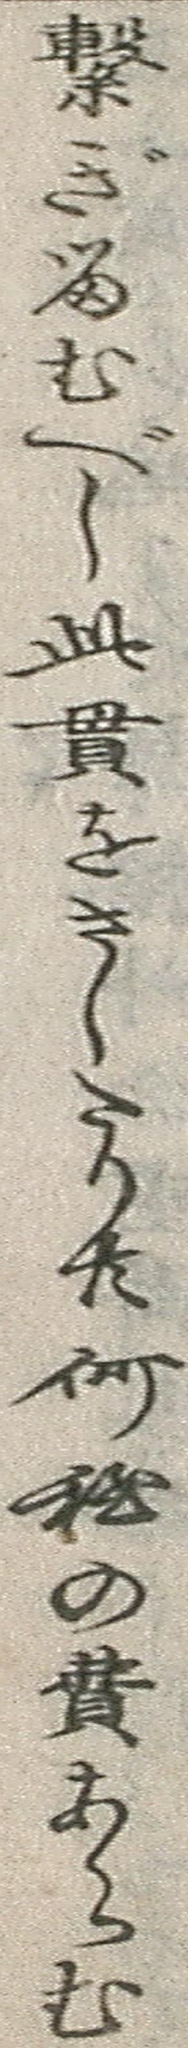繋ぎ留むべし此貫をさしたり共何程の費あらむ
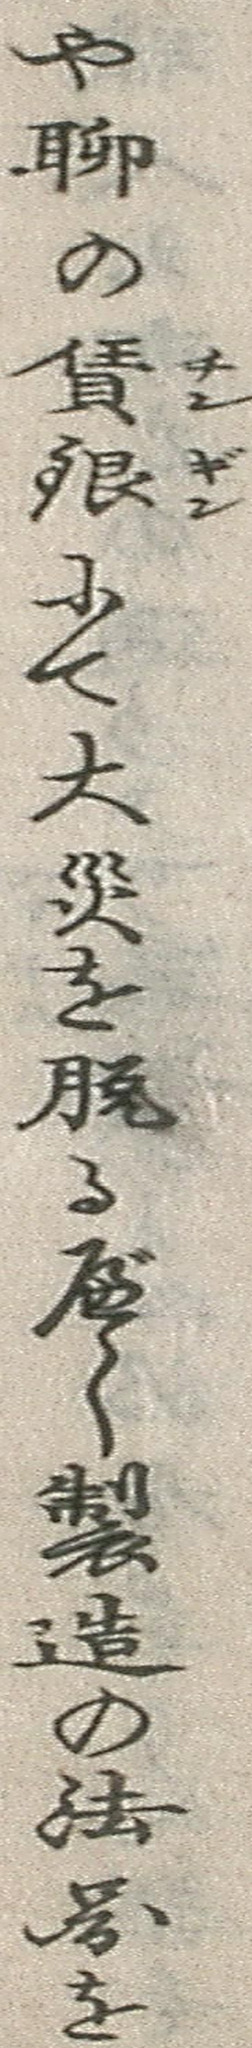や聊の賃銀にて大災を脱るべく製造の法図を
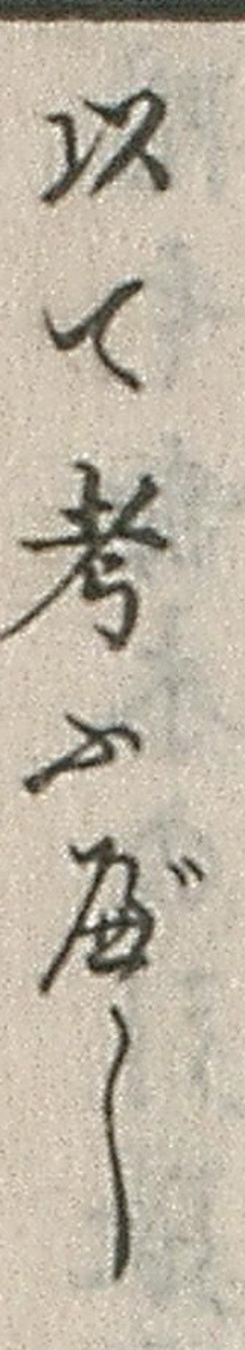以て考ふべし
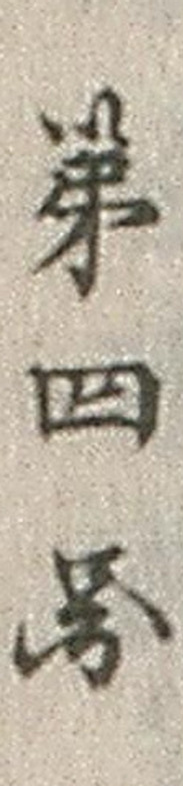第四図

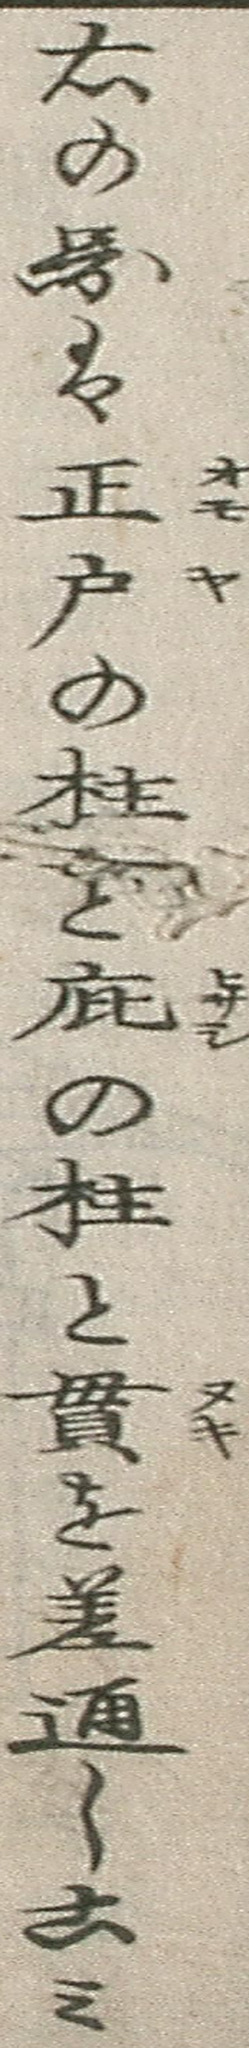右の図は正戸の柱と庇の柱と貫を差通しこみ
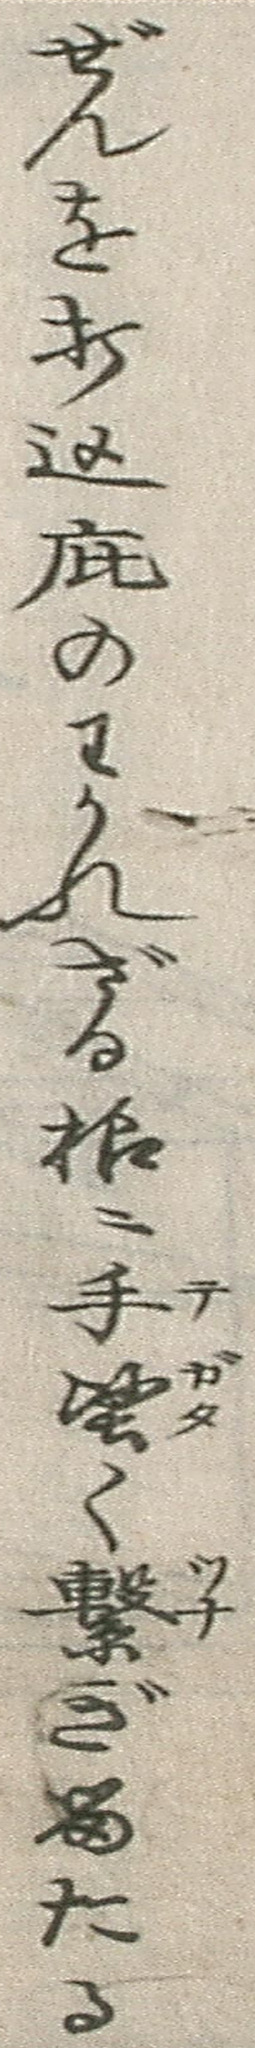ぜんを打込庇のわかれざる様手堅く繋ぎ留たる
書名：附録　地震劇風災害豫防法圖説（内題）
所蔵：東京大学地震研究所図書室 Earthquake Research Institute Library, The University of Tokyo, JAPAN
